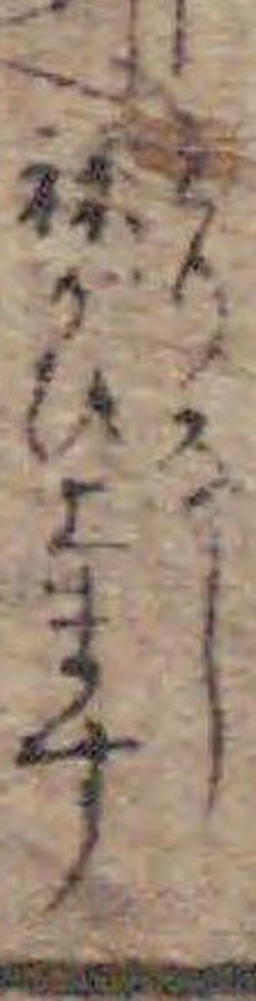ねがひ上ます
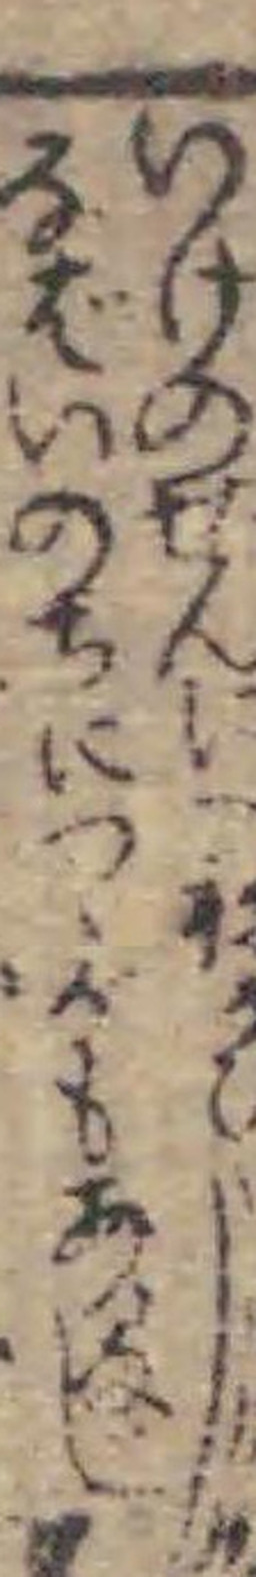なばいのちにつゝがもあるまし
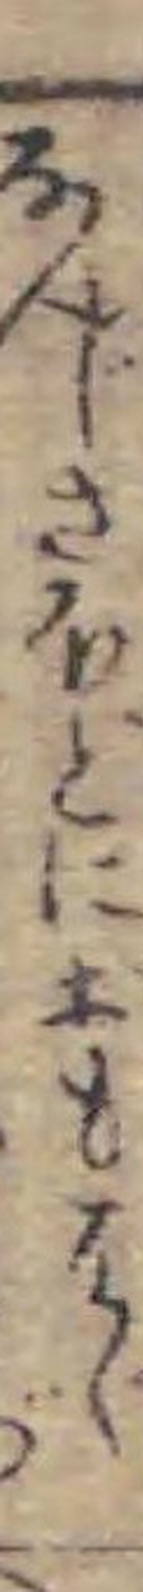なんじさほどにおもはく
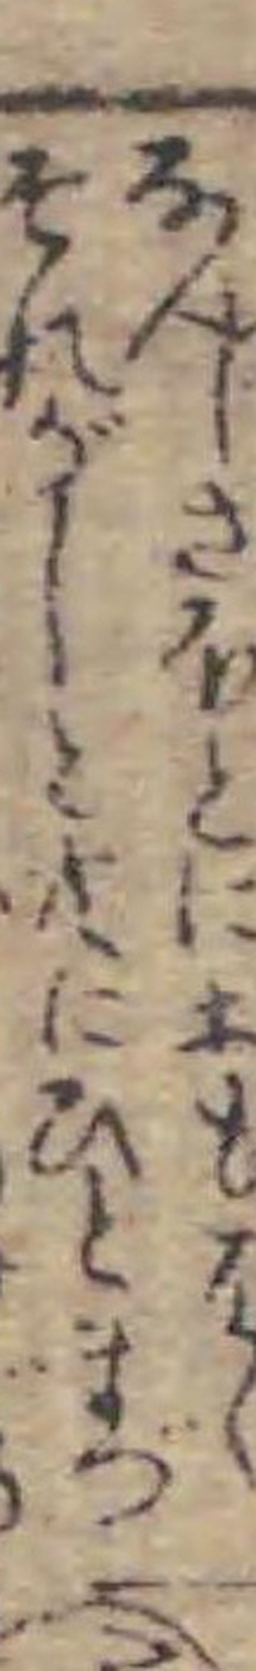それがしと共にひとまづ
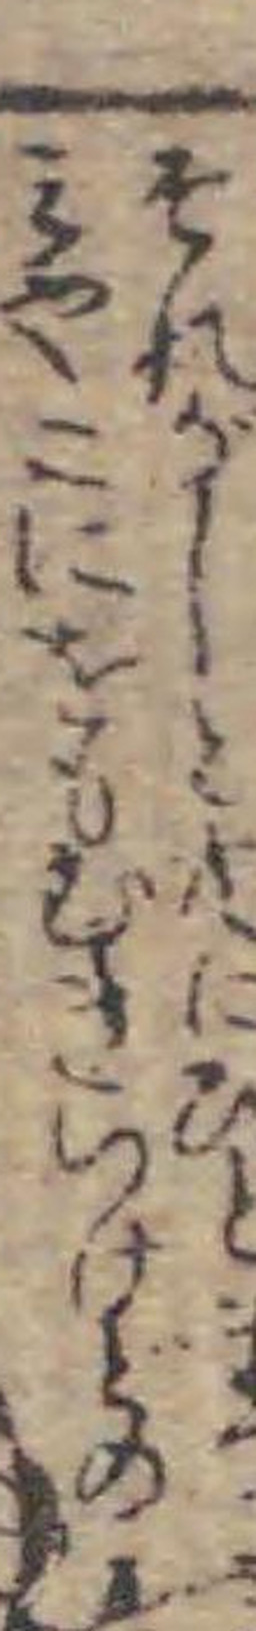みやこにおもむきいけどの
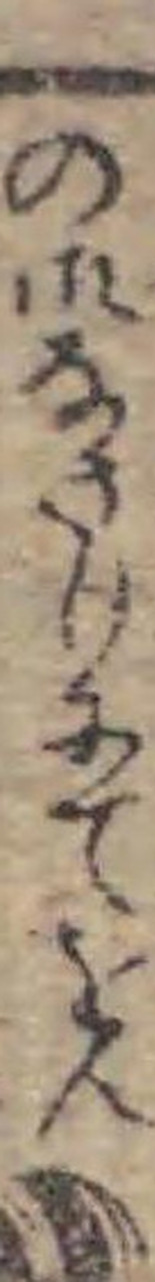の御なさけにてをん
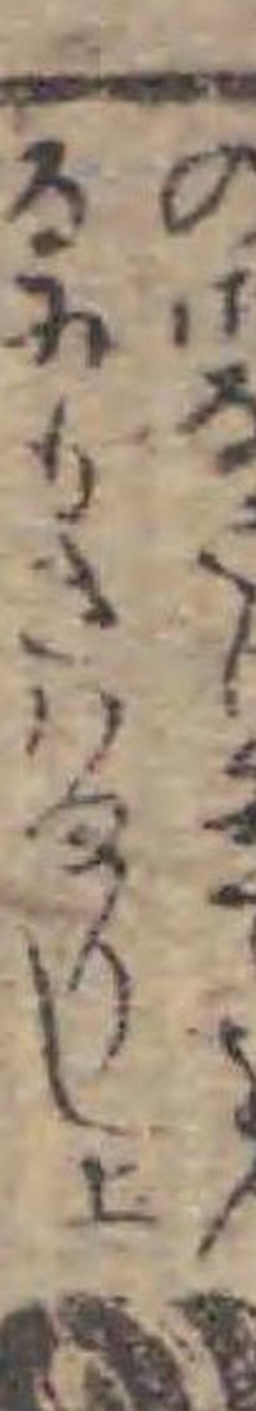なゐ３もきはまりし上
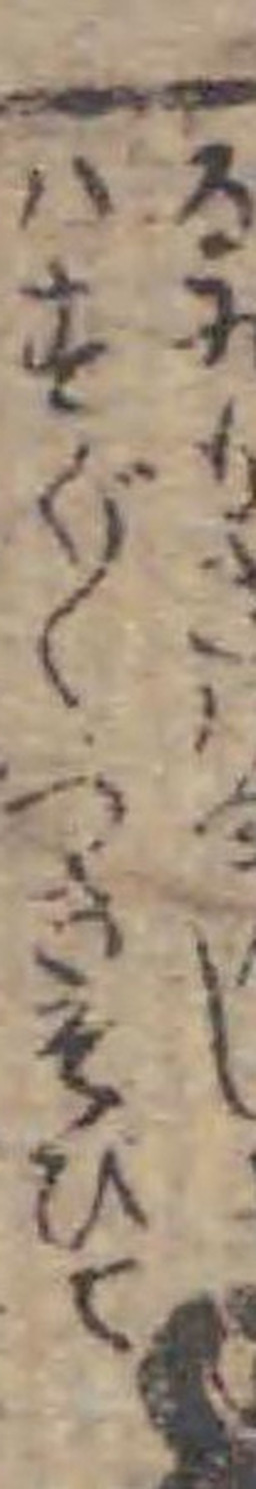はすぐ〴〵つきそひて
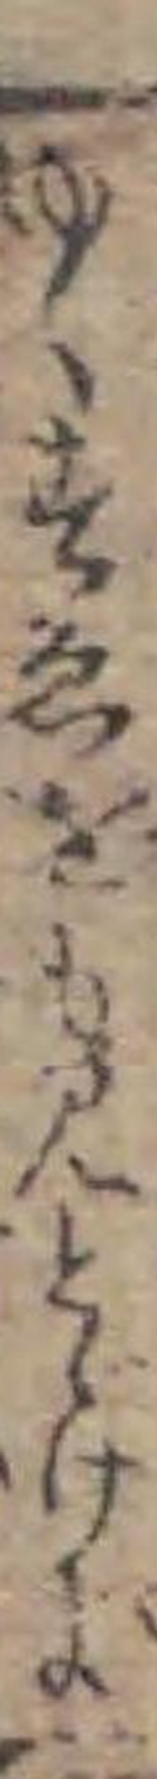ゆくすゑをも見とゞけよ
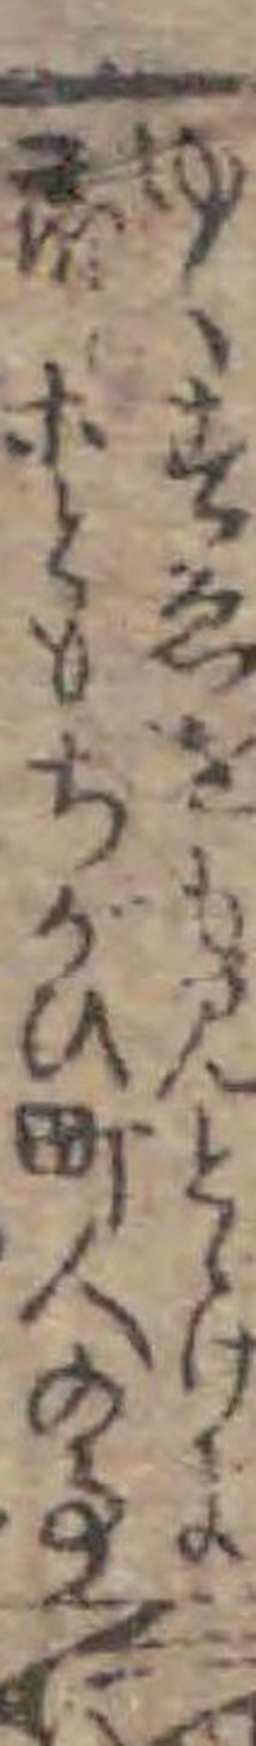郎等ともちがひ町人の事
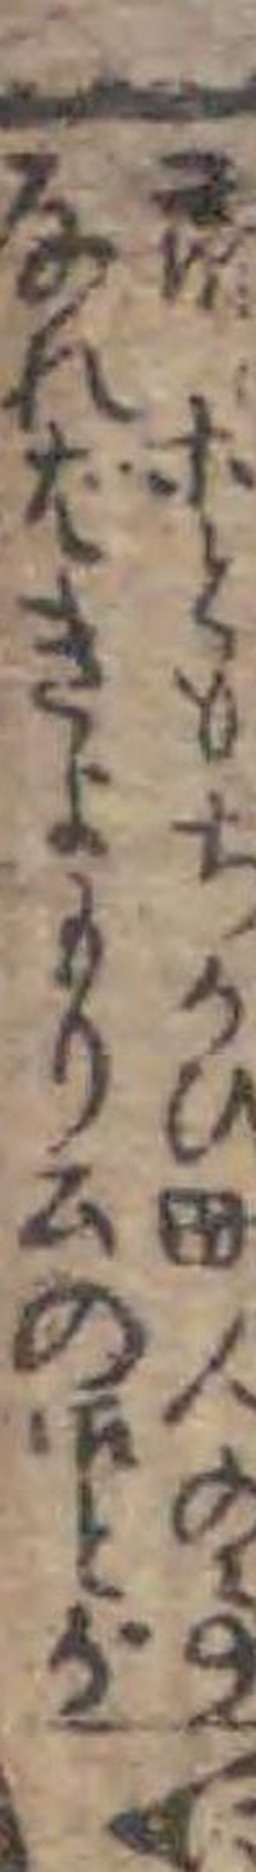なればきよもり公の御とが
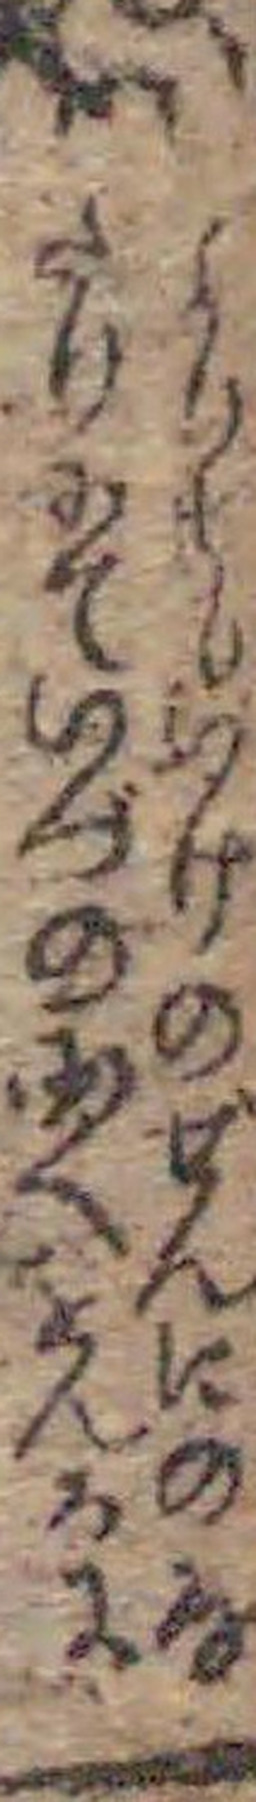さけにていづの国へをんろに
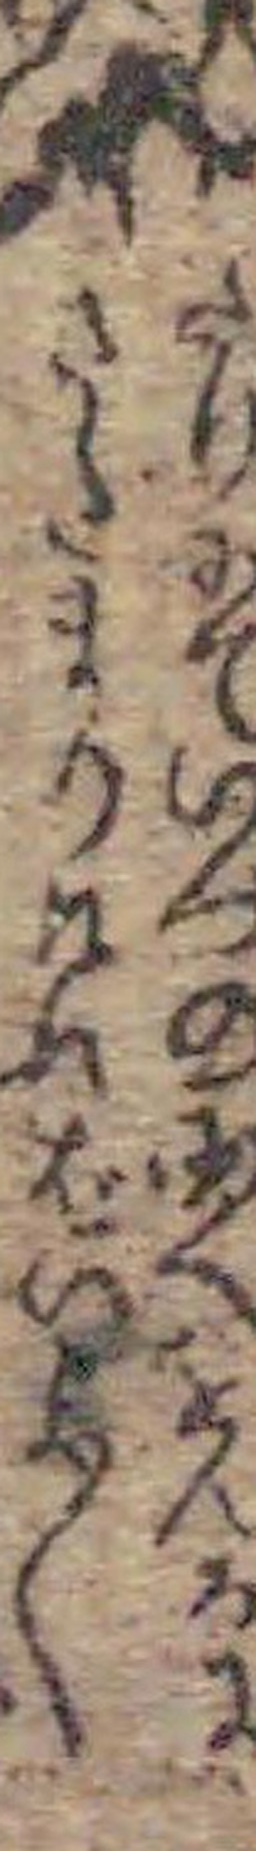さだまりければいよ〳〵
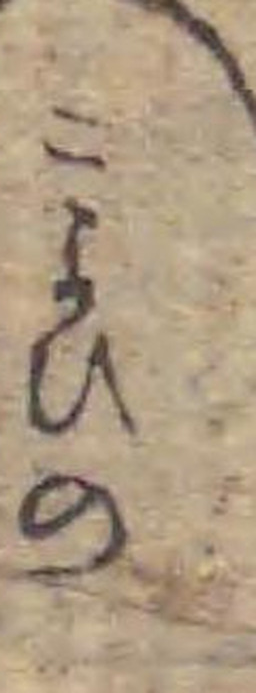こよひの
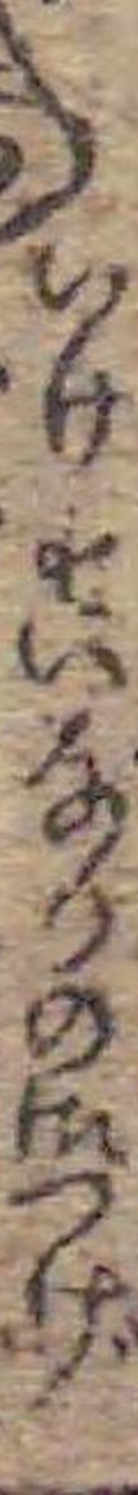いけすいなりの御つげ
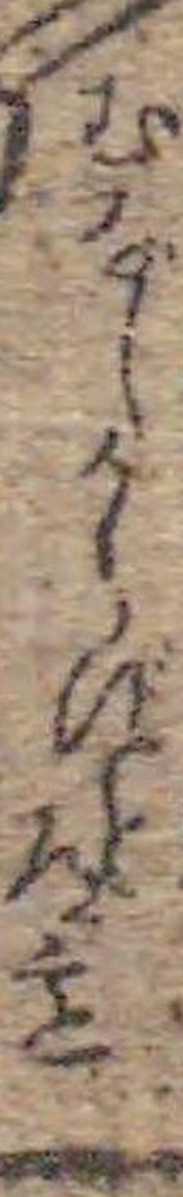むなしからずと道意
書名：三舛増鱗組 : 3巻
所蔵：国立国会図書館 National Diet Library, JAPAN
